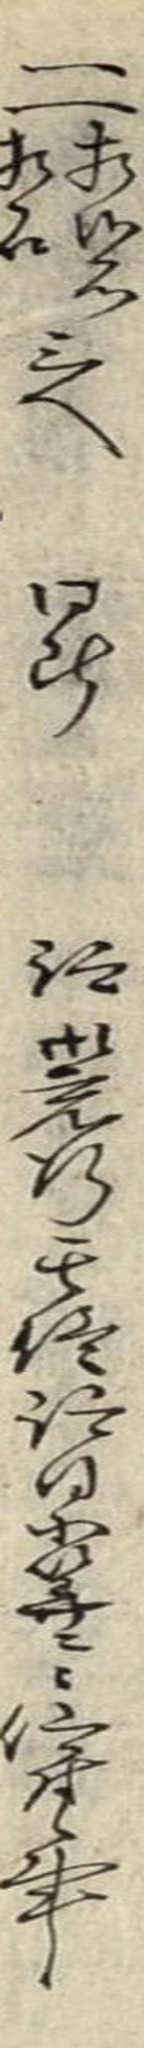一拾弐石拾石三人同断跡御充行其侭跡目小算に被仰付候事
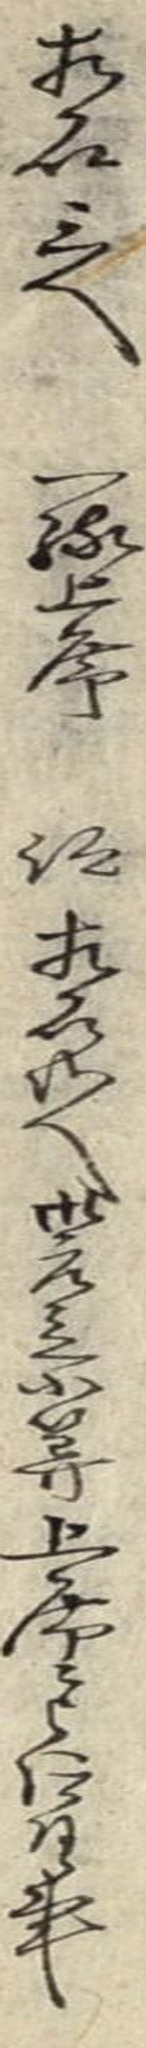一拾弐石三人一統上席跡拾石弐人御取立小算上席に被仰付候事
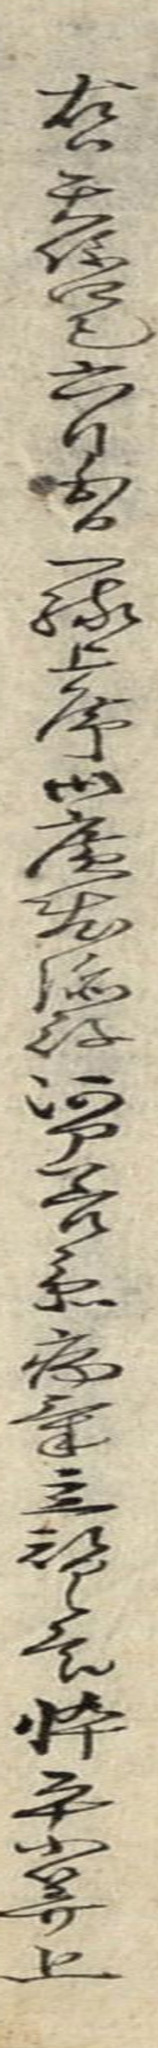右は天保四巳六月五日一統上堰御座敷添役河部善兵衛病気立替之節忰平小算上
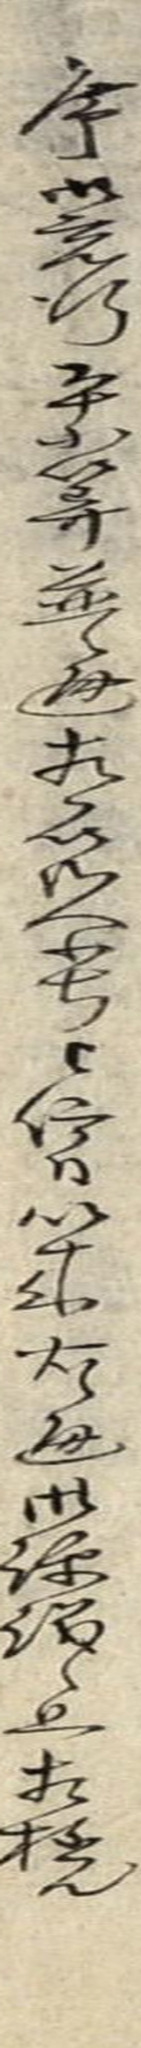席御充行平小算並之通拾石弐人ふち被仰付以来右之通御評議之上相極候
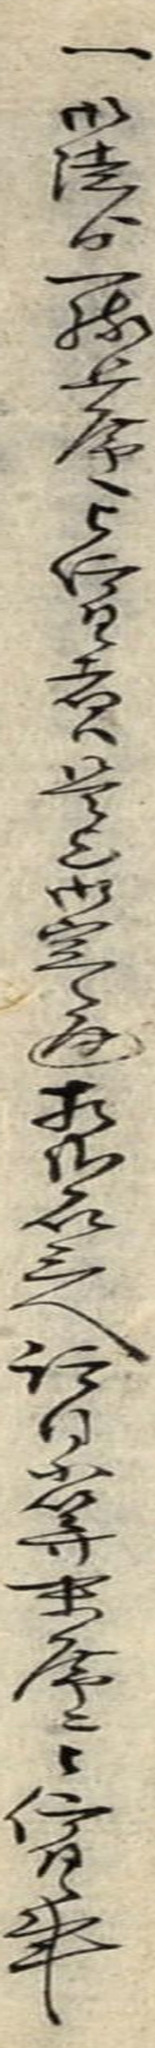一御徒ゟ一統上席へ被仰付候者は是迄御定之通拾弐石三人跡目小算末席に被仰付候事
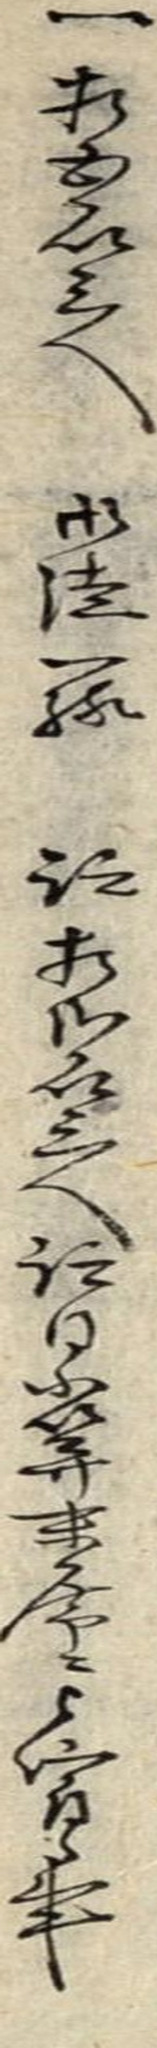一拾五石三人御徒一統跡拾弐石三人跡目小算末席に被仰付候事
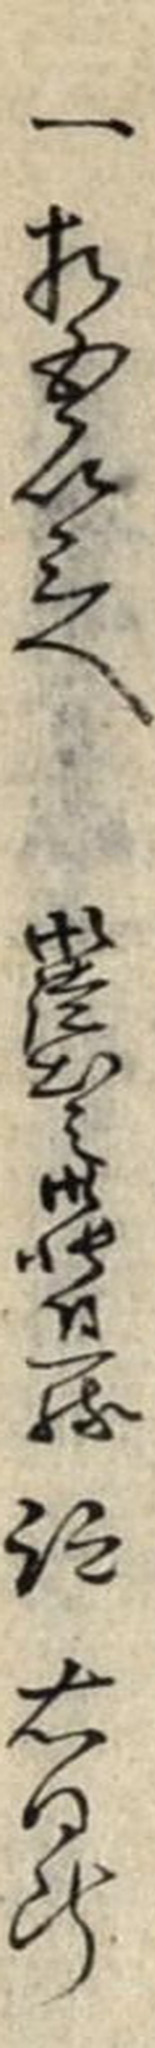一拾五石三人御徒出之御帳付一統跡右同断
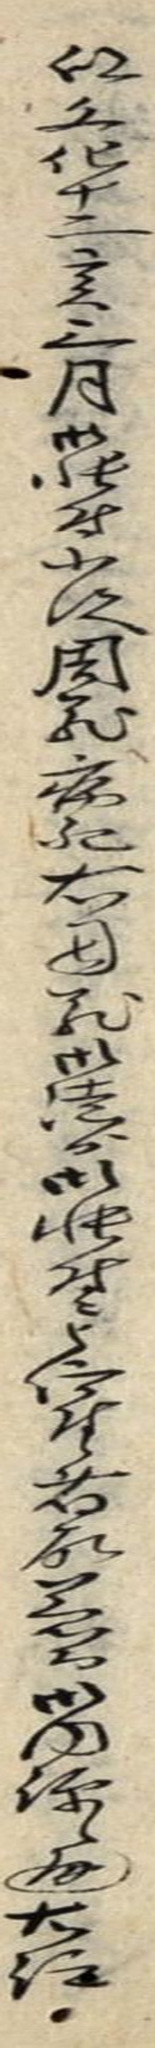但文化十二亥三月御帳付小沢周蔵病死右周蔵御徒ゟ御帳付被仰付候者故兼而御内評之通右跡

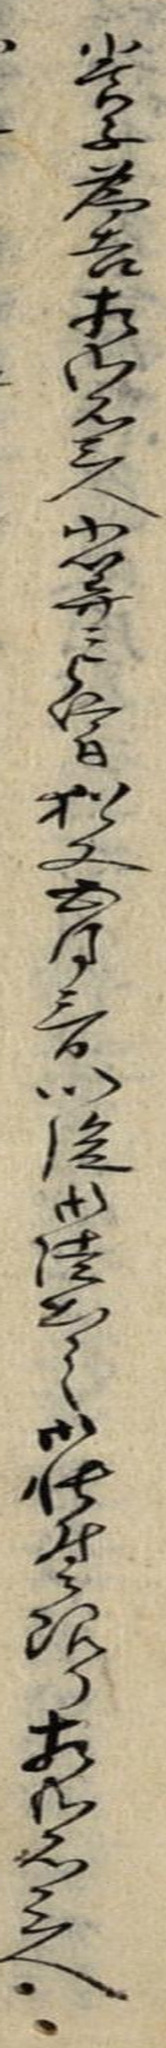養子為吉拾弐石三人小算に被仰付猶又五月三日以後御徒出之御帳付に限り拾弐石三人
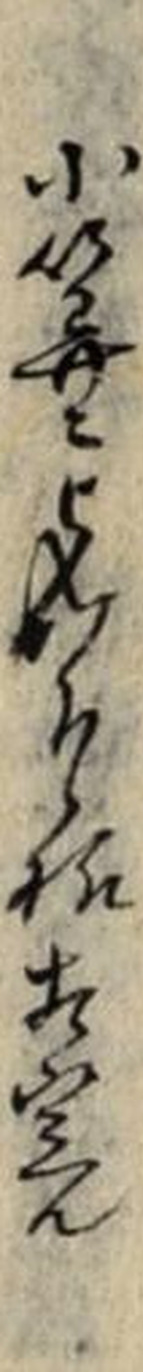小算に被成下候様相定ル
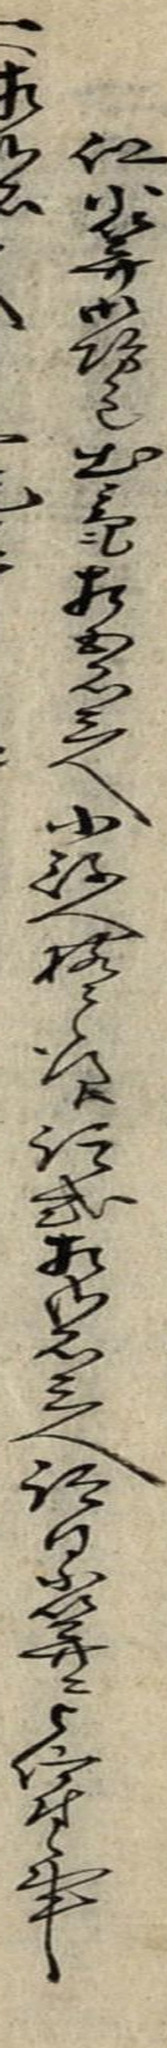但小算御坊主出に而も拾五石三人小役人格に候得は跡式拾弐石三人跡目小算に被仰付候事
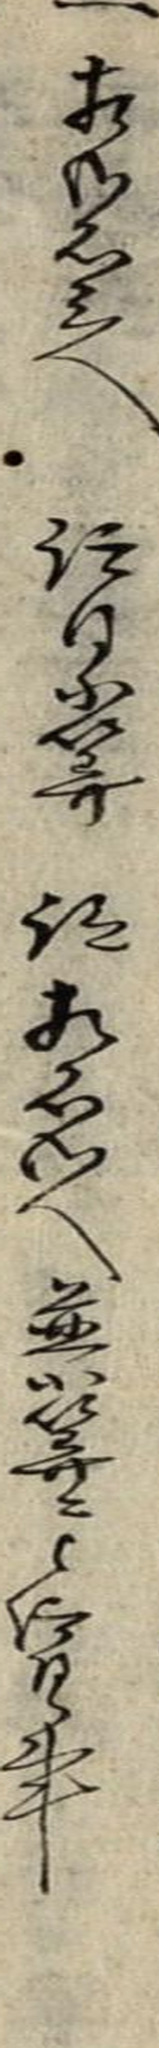一拾弐石三人跡目小算跡拾石弐人並小算に被仰付候事
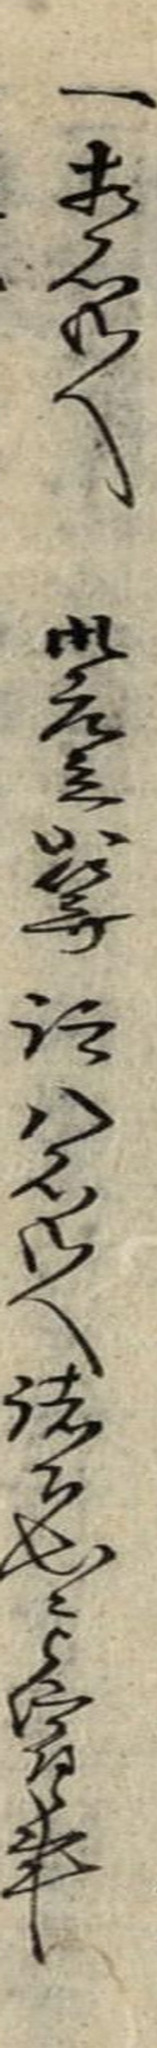一拾石弐人御取立小算跡八石弐人徒下代に被仰付候事
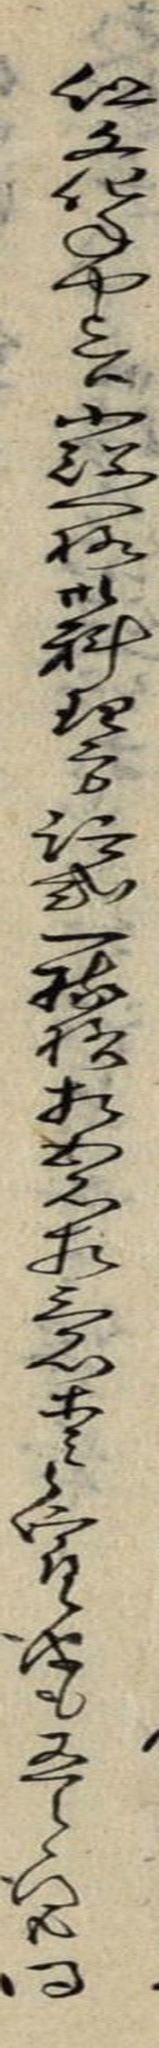但文化年中迄は小役人格御料理方跡式一統格拾五石拾三石等に被仰付候儀も有之候得共同
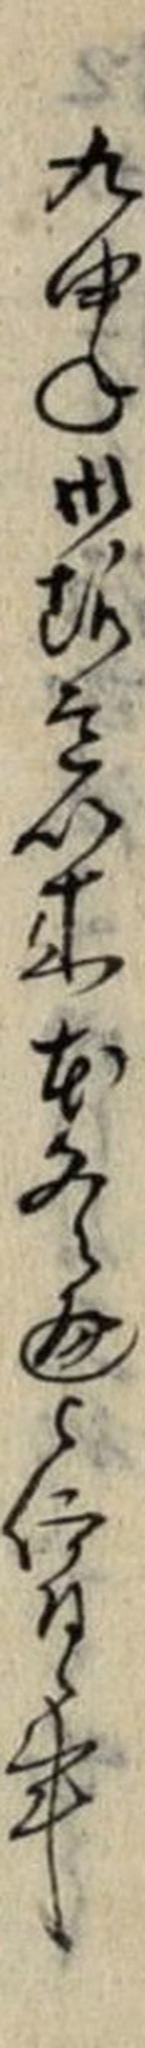九申年御趣意以来本文之通被仰付候事
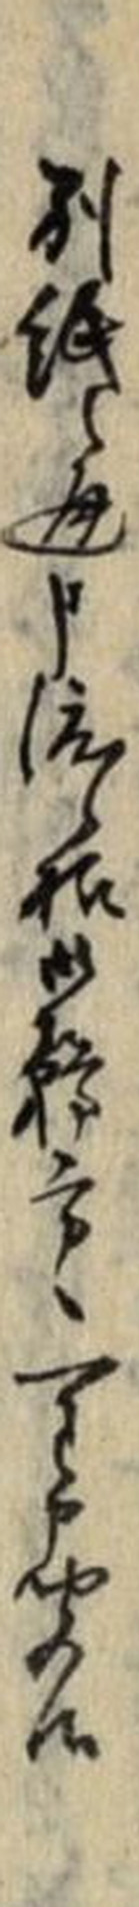別紙之通申渡候様御鵜方へ可被申聞候
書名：御用并被仰出之部
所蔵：福井県文書館 Fukui Prefectural Archives
